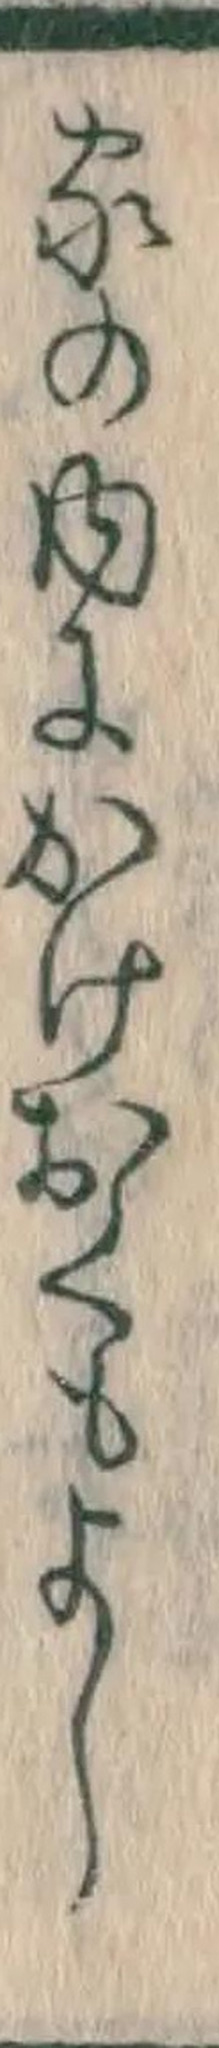家の内にかけおくもよし
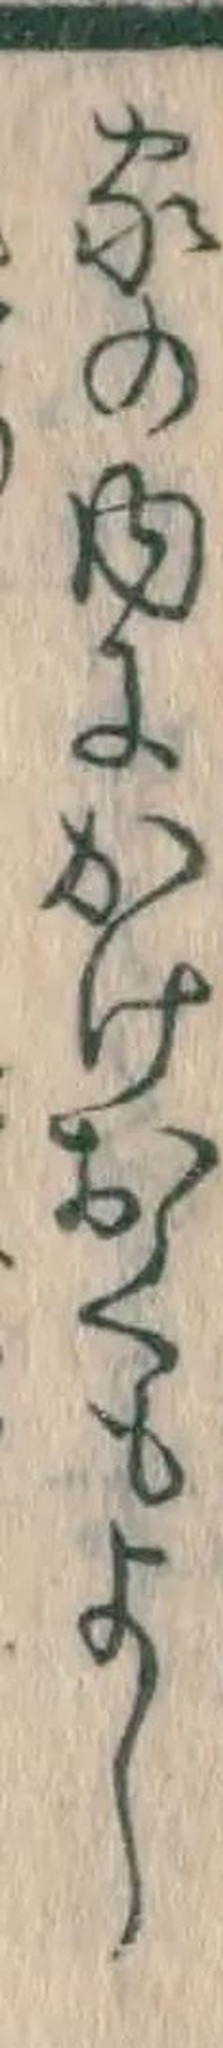家の内にかけおくもよし
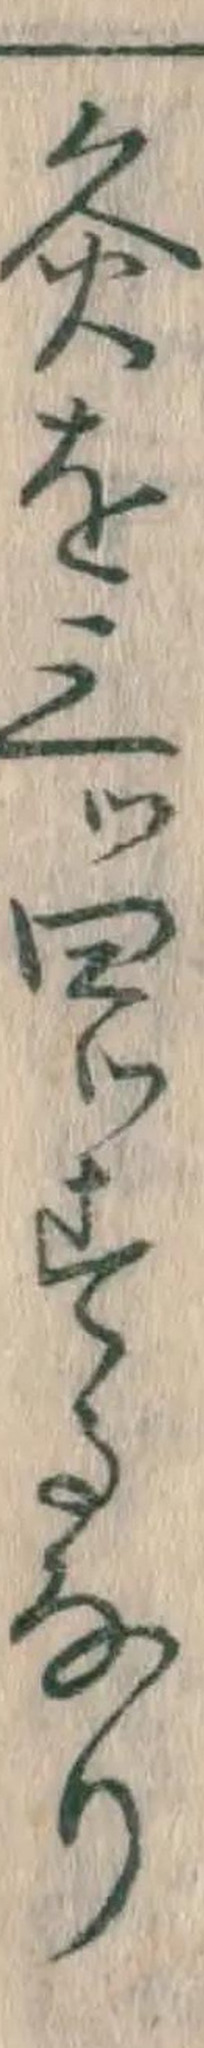灸を三ッ四ッするなり
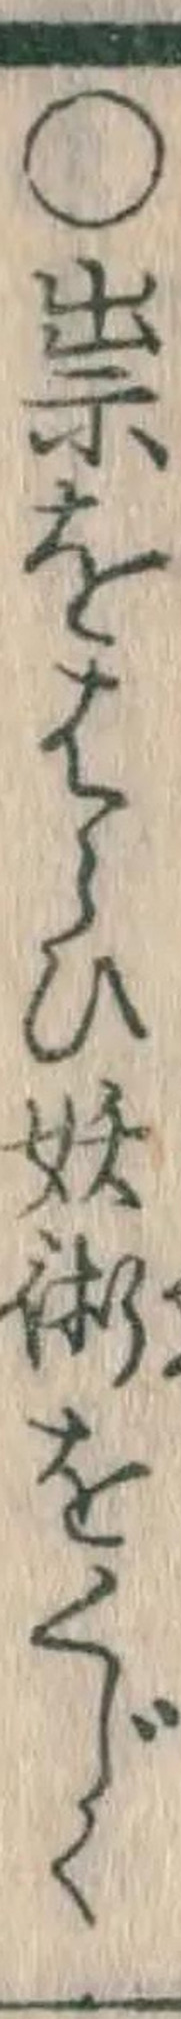○祟をはらひ妖術をくじく
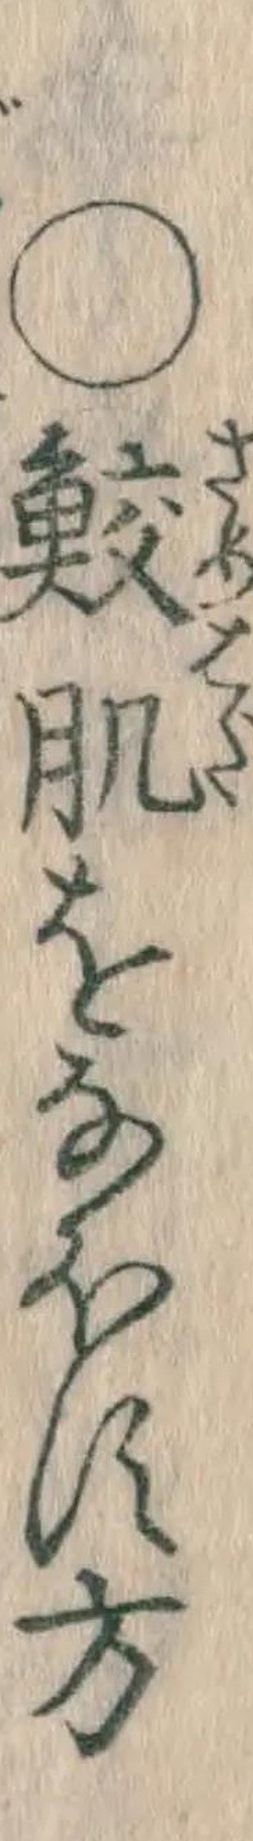○鮫肌をなほす方
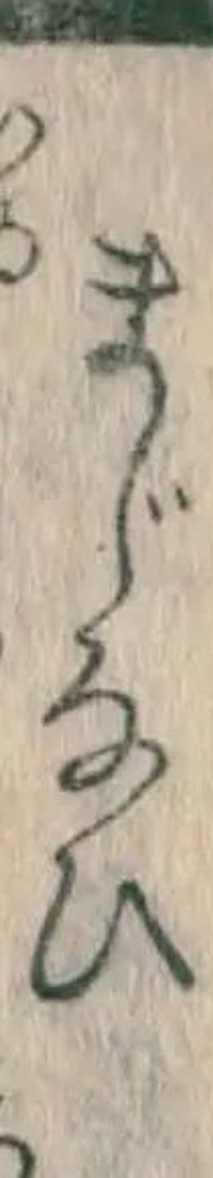まじなひ
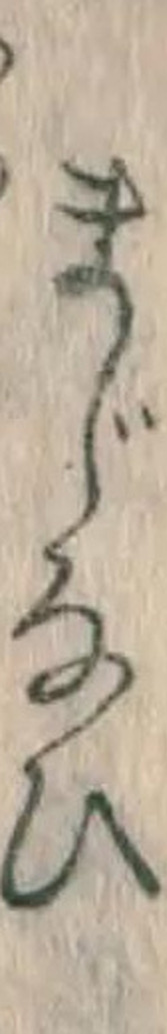まじなひ
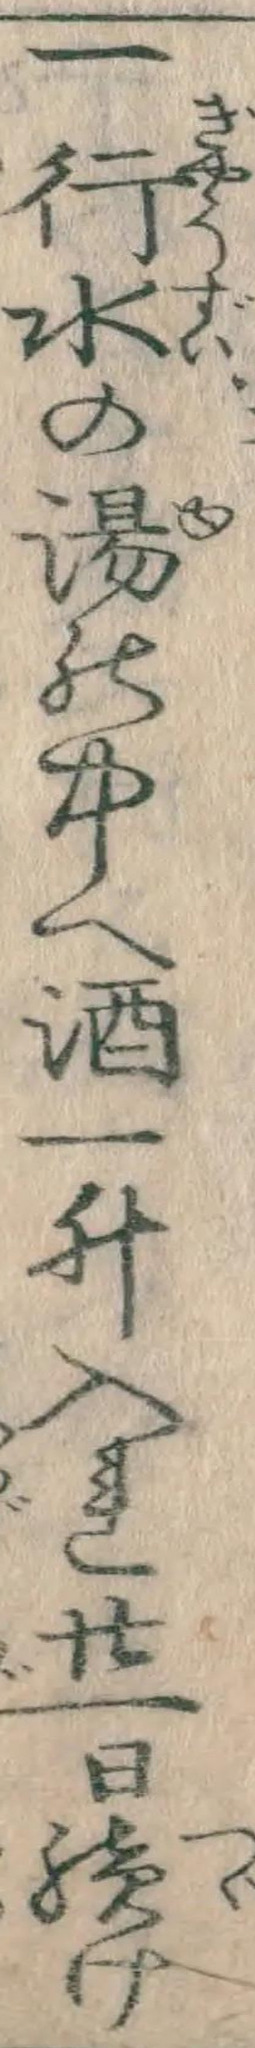一行水の湯の中へ酒一升入れ廿一日続け
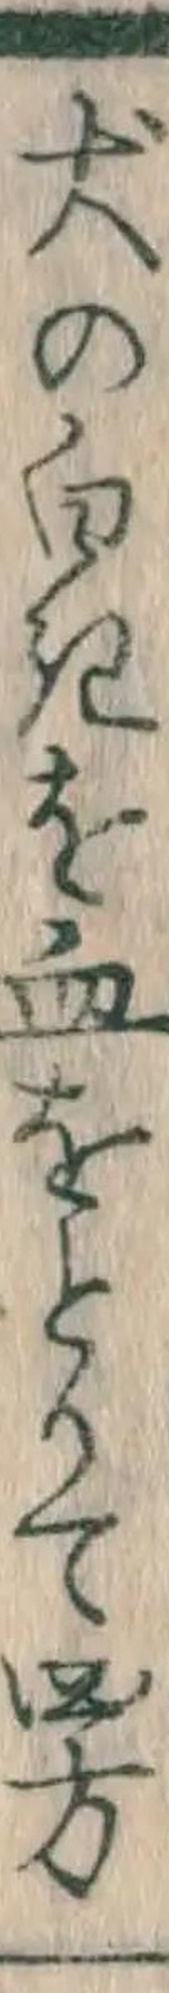犬の白きを血をとりて四方
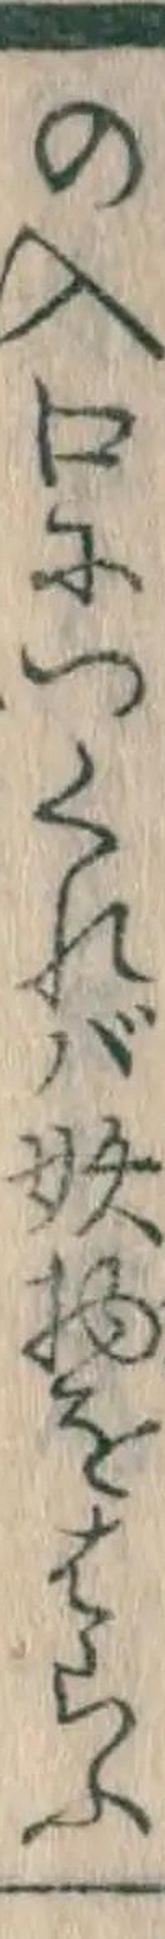の入口につくれば妖物をはらふ
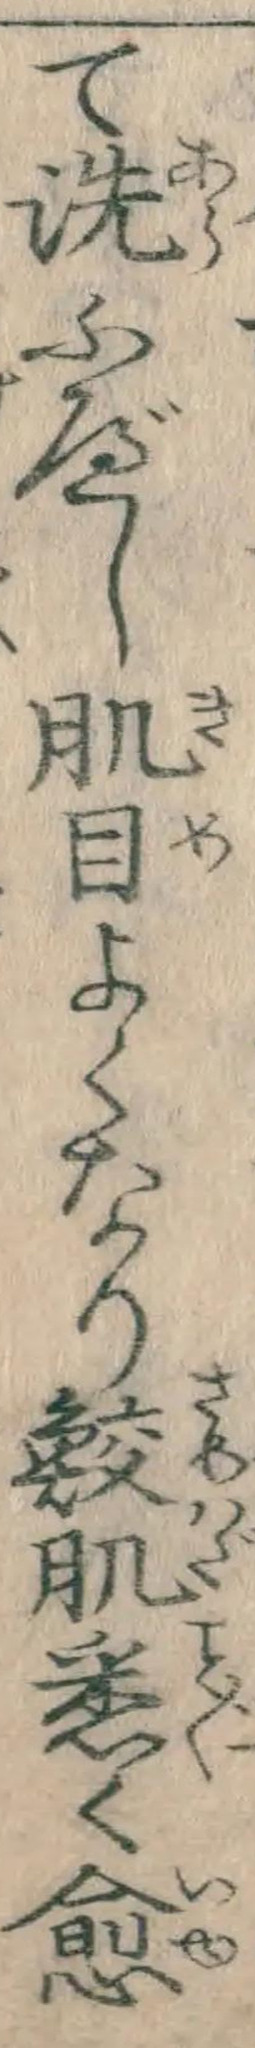て洗ふべし肌目よくなり鮫肌悉く愈
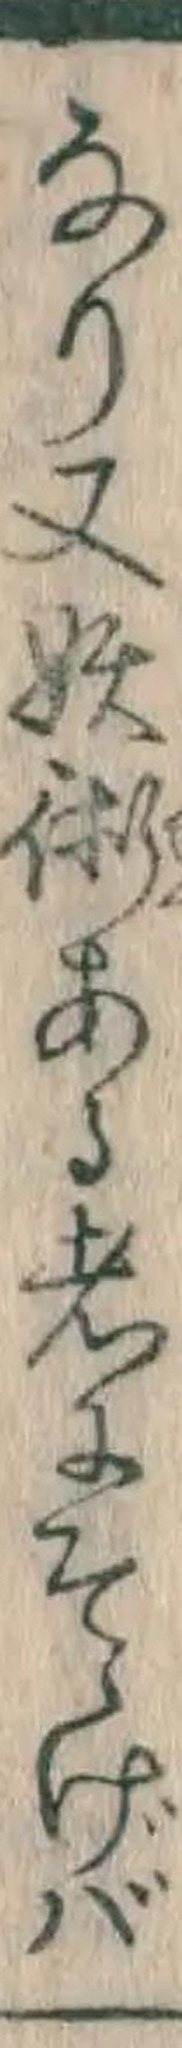なり又妖術ある者にそゝげば
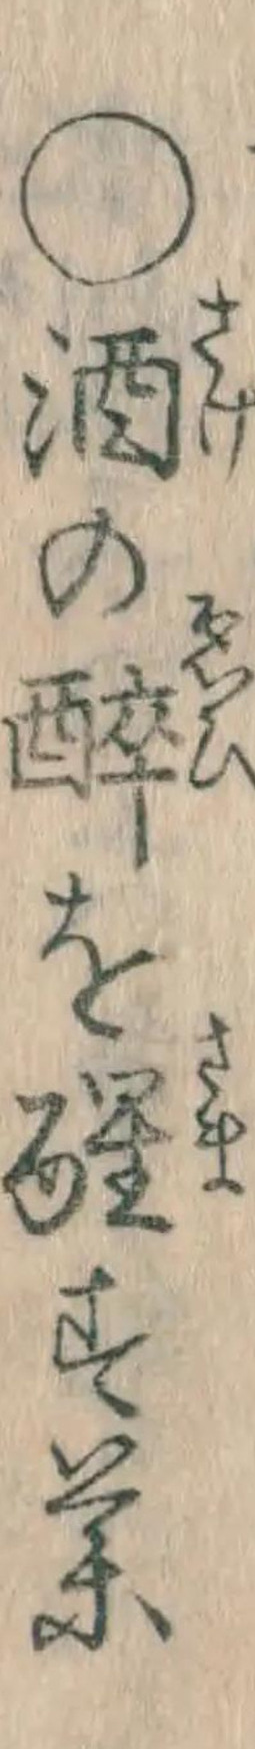○酒の酔を醒す薬

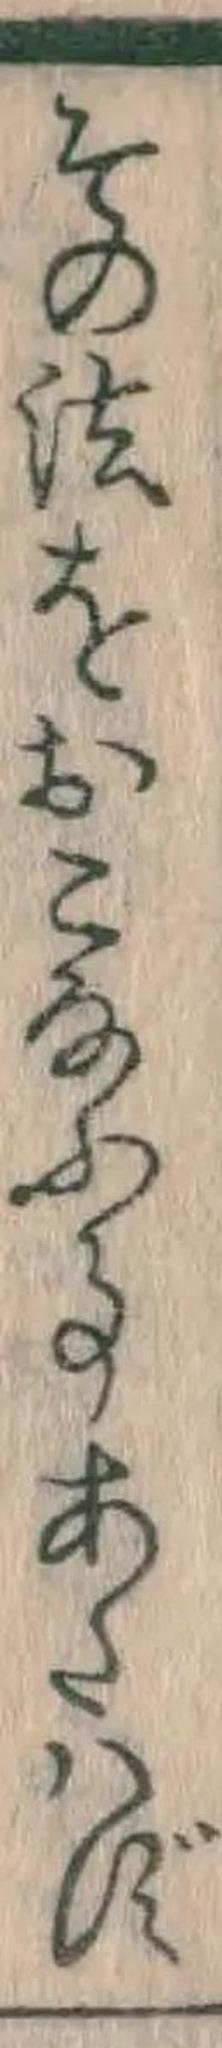その法をおこなふ事あたはず
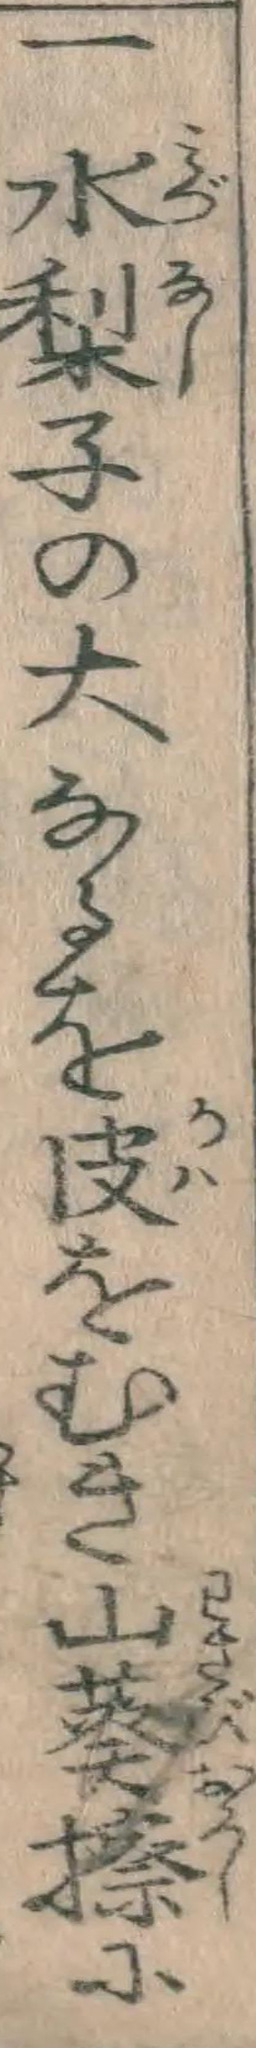一水梨子の大なるを皮をむき山葵擦に
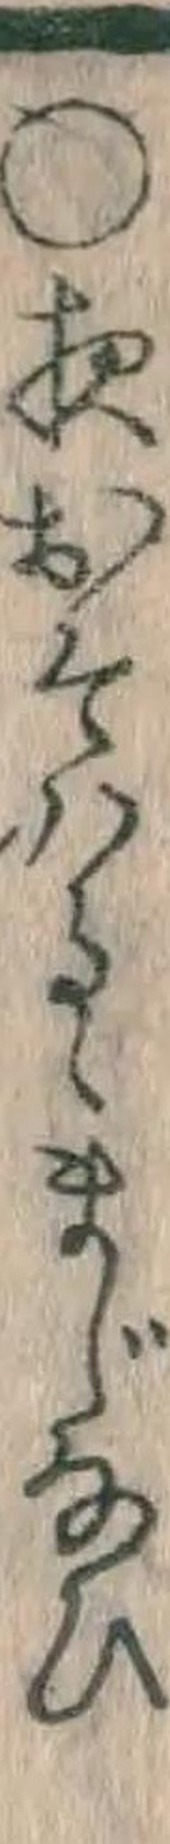○夜おそはるゝまじなひ
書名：広益秘事大全 3巻. [4]
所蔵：国立国会図書館 National Diet Library, JAPAN
